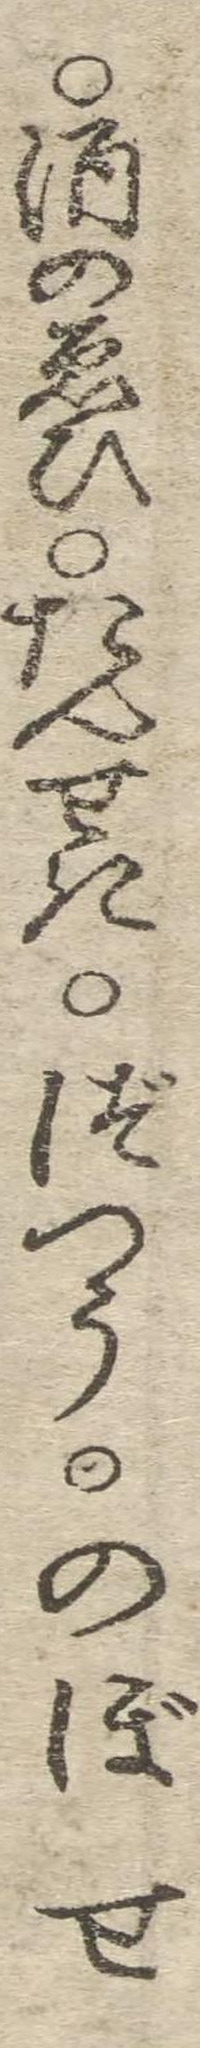○酒のゑひ○たんせき○づつう○のぼせ
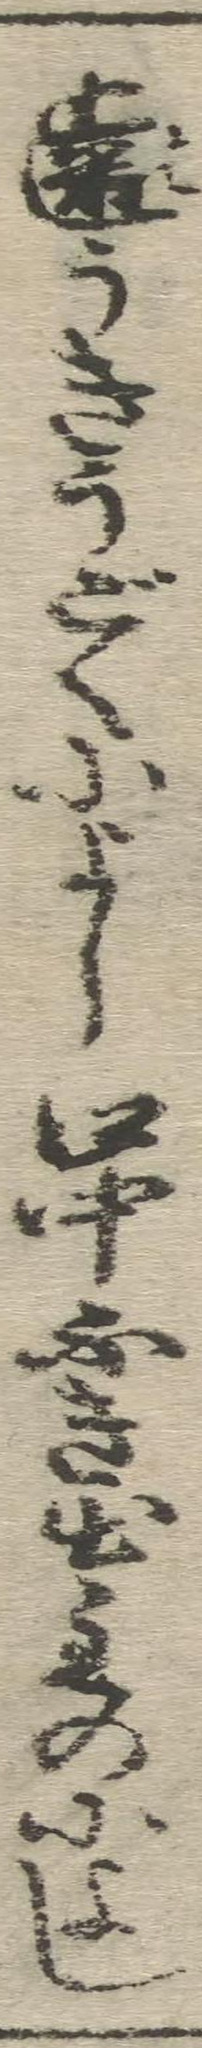歯うきうごくによし口中ふき出ものによし
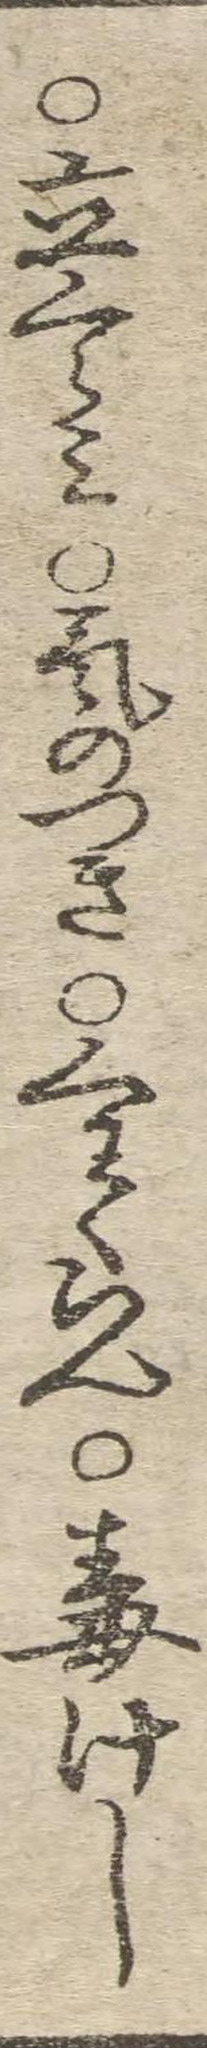○立くらみ○気のつき○くわくらん○毒けし
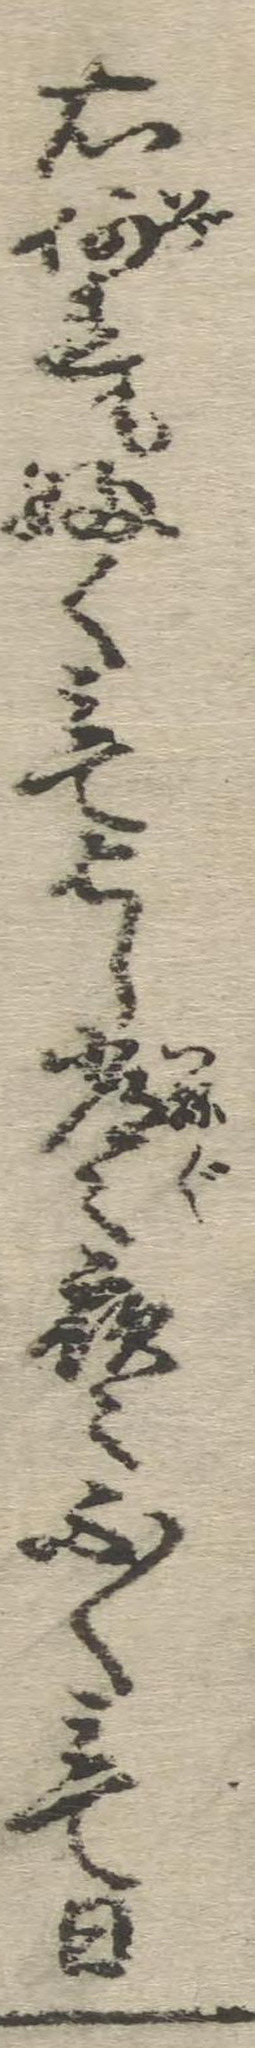右何れもふくみてよし常々夜々ふくみて日
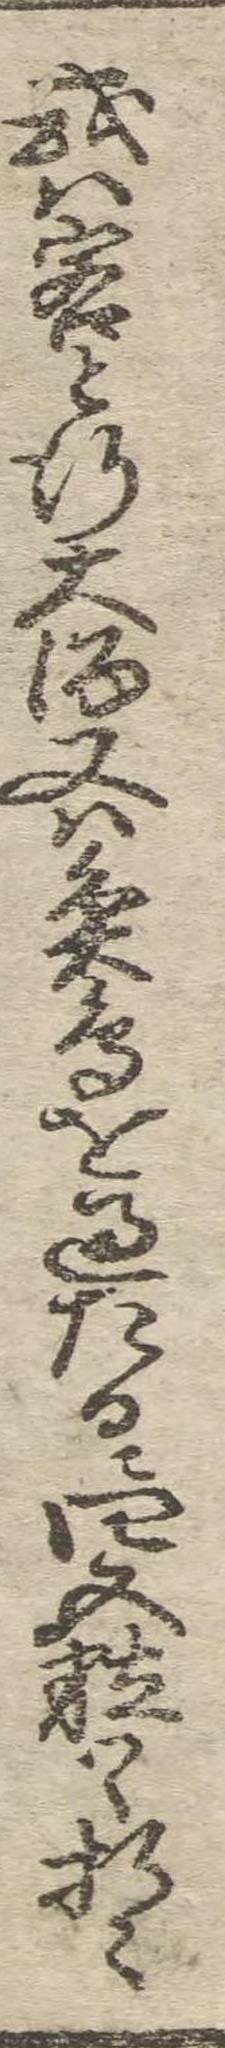或は客と行大酒又は魚鳥を過たるに四五粒つゝ折々
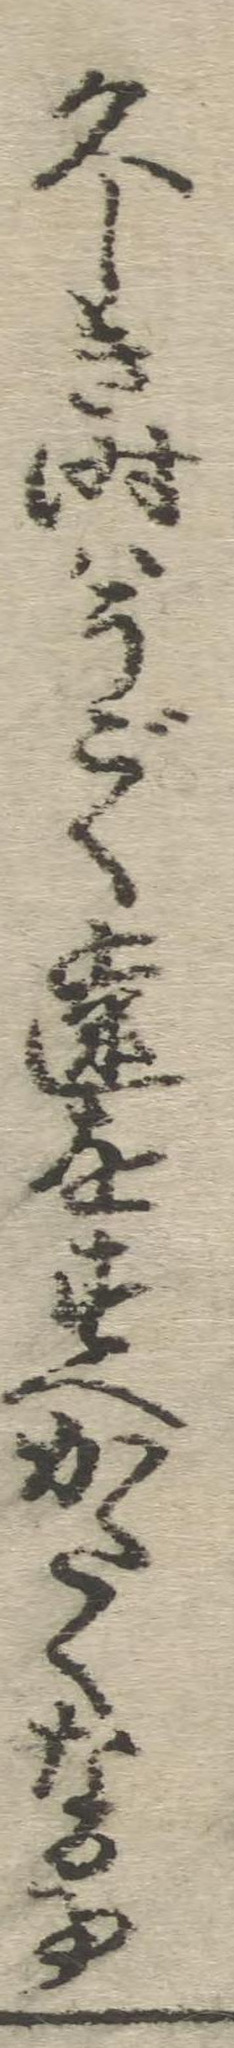久しき時はうごく歯をすへかたくなる事
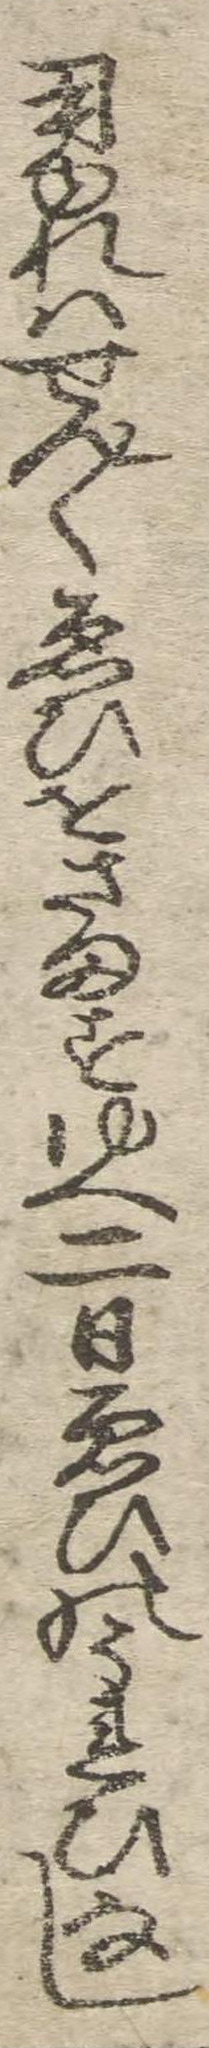用ゆれはせん〳〵ゑひをさますゆへ二日ゑひのうれひなし
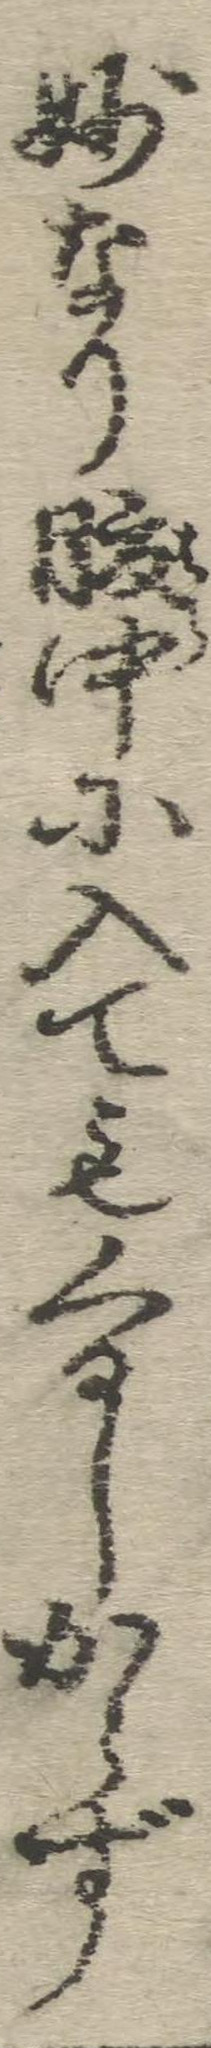妙なり腹中に入てもくるしからず
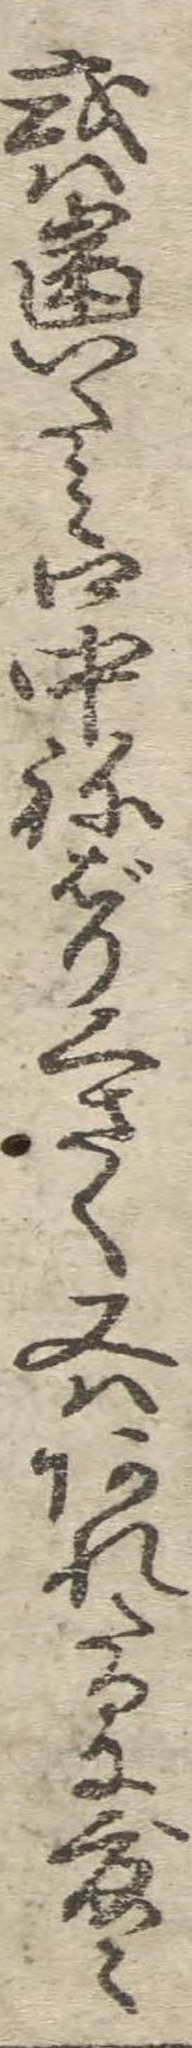或は歯いたみ口中ねばりくさく又はあれたるに度々
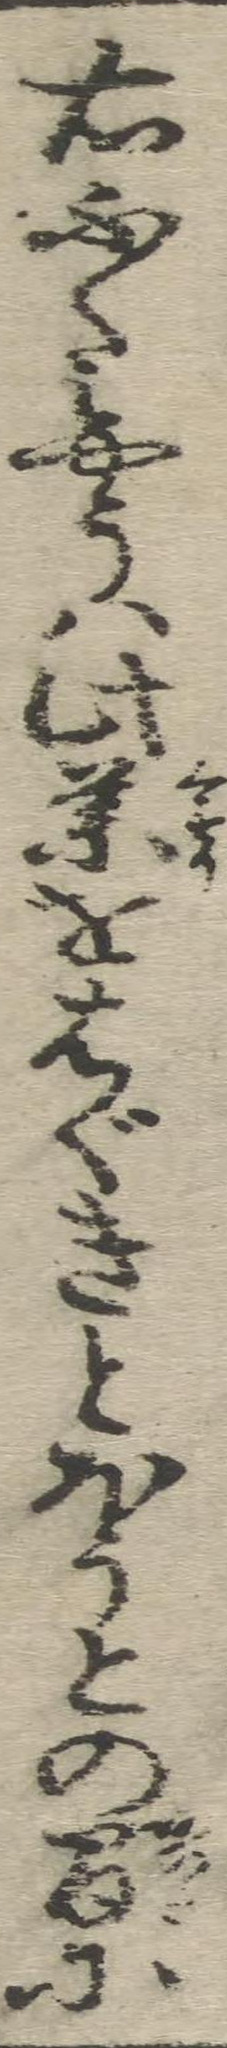右ふくみやうは此薬をはぐきとほうとの間に
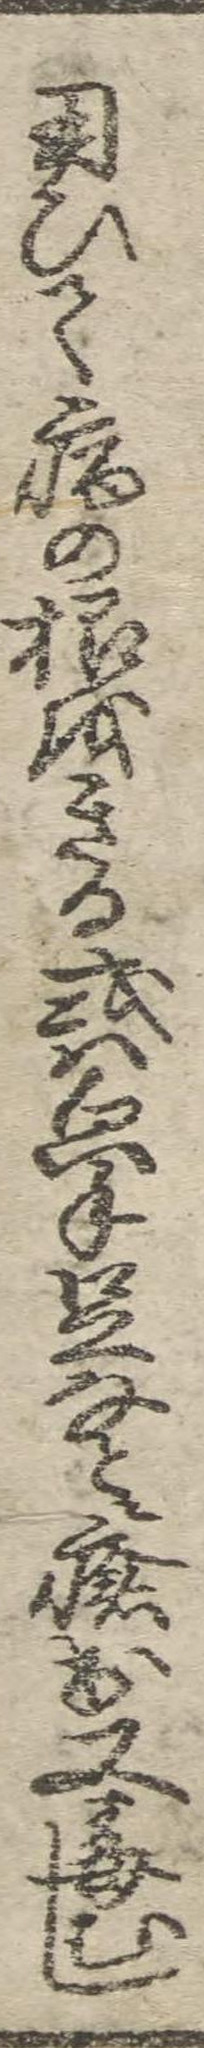用ひて病の根をきる或は貌手足なとに瘉出又毒むし
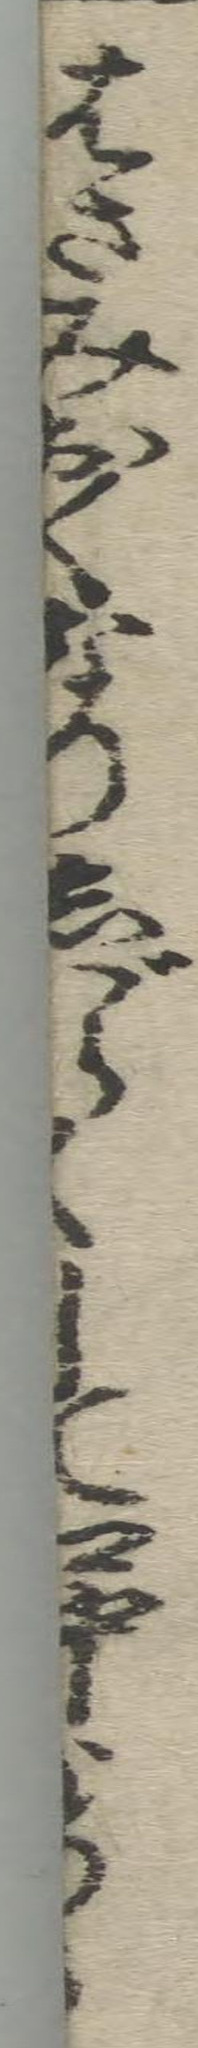はさみおくなりしばらくして口中よりうみ

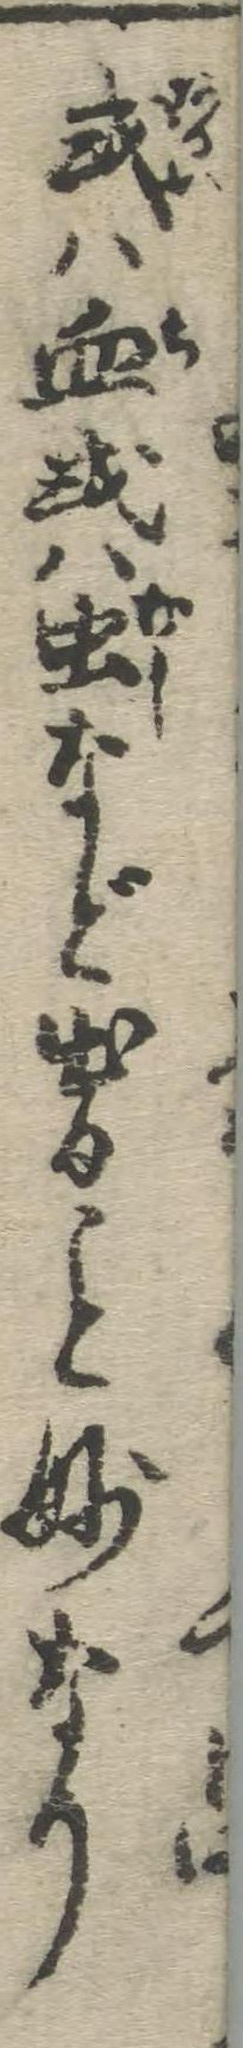或は血或は虫など出ること妙なり
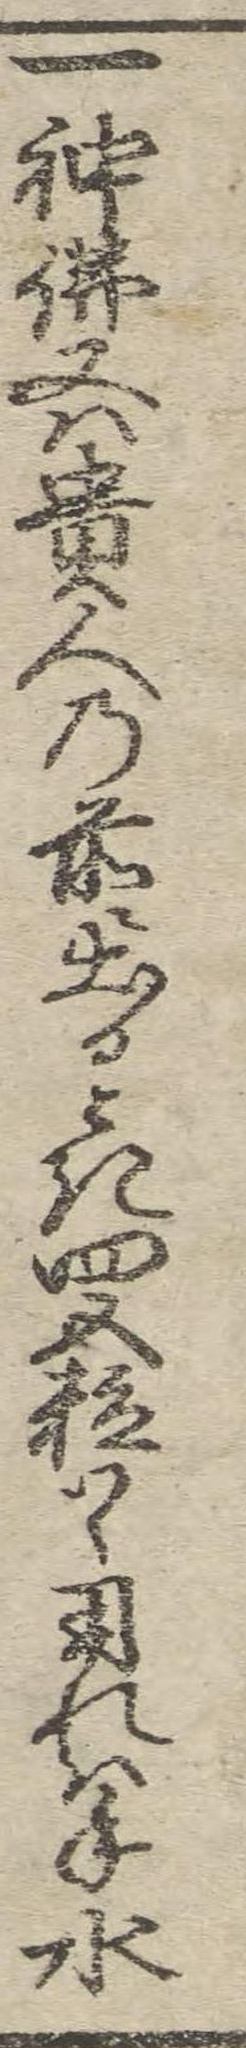一神仏又は貴人の前に出るとき四五粒つゝ用れは手水
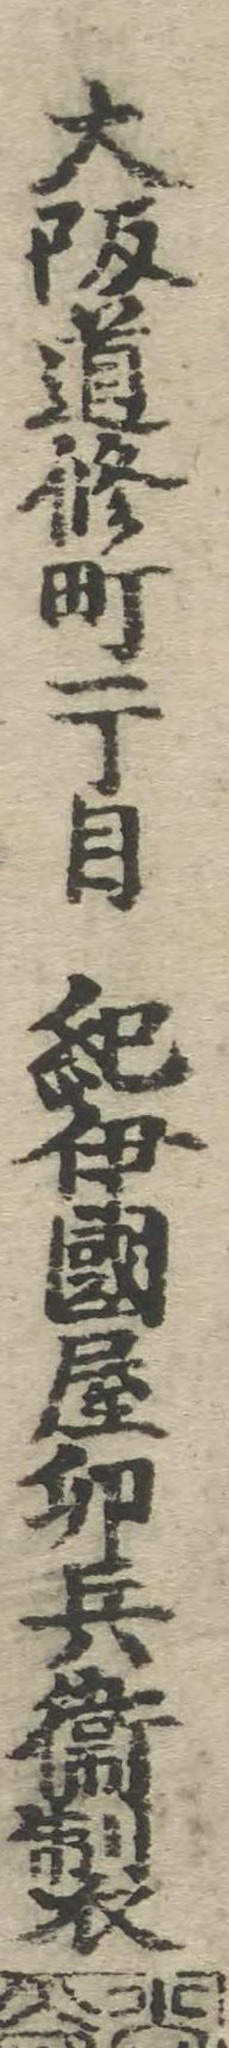大阪道修町一丁目紀伊国屋卯兵衛製
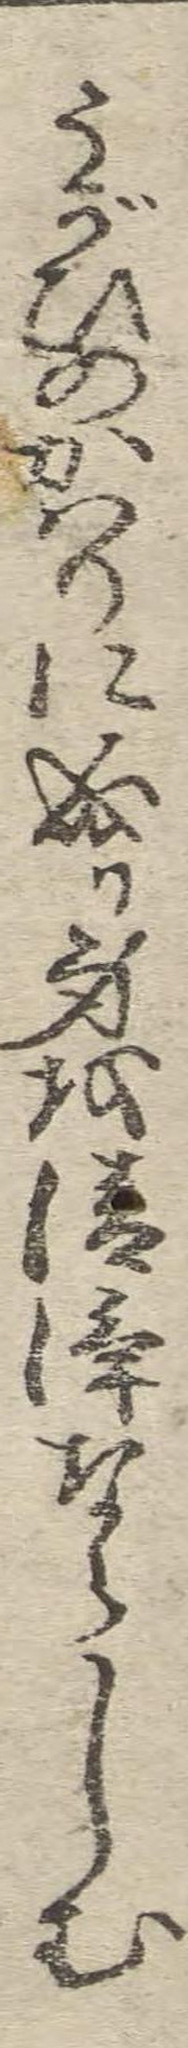うがひのかはりに成り身を清浄ならしむ
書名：浪華薬種問屋能書張交帖. 二
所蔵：国立国会図書館 National Diet Library, JAPAN
